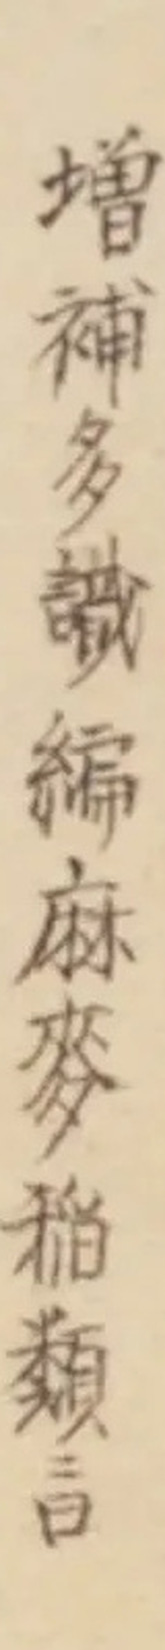増補多識編麻麦稲類ニ曰
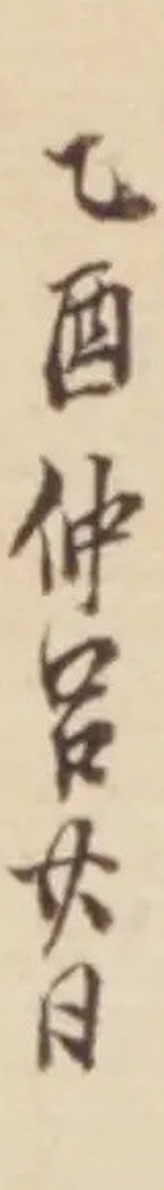乙酉仲呂廿日

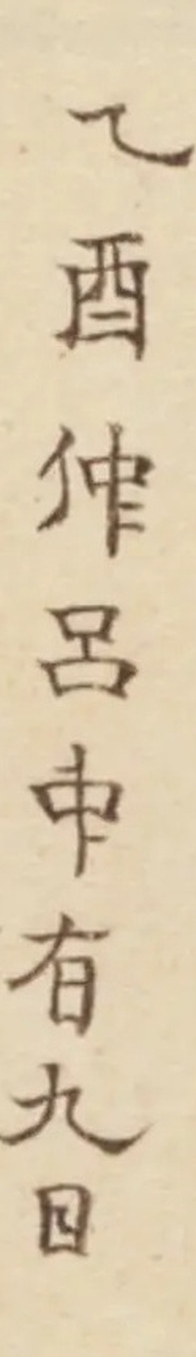乙酉仲呂中有九日
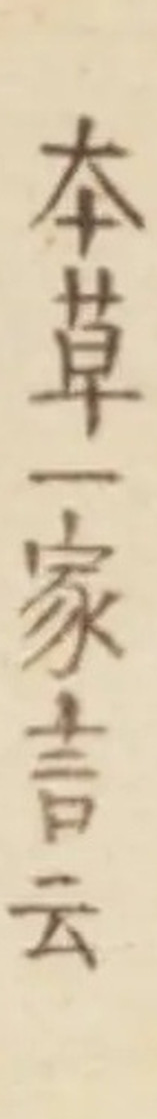本草一家言云
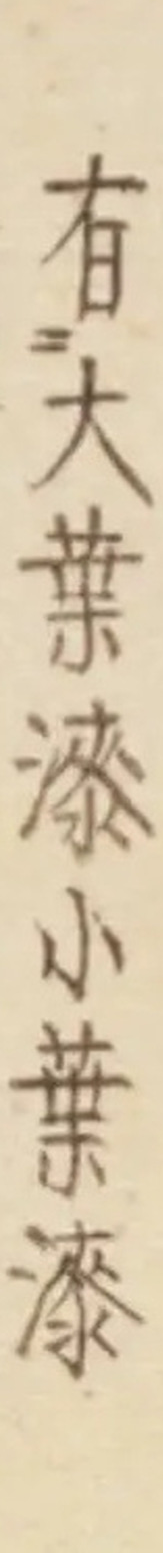有大葉漆小葉漆
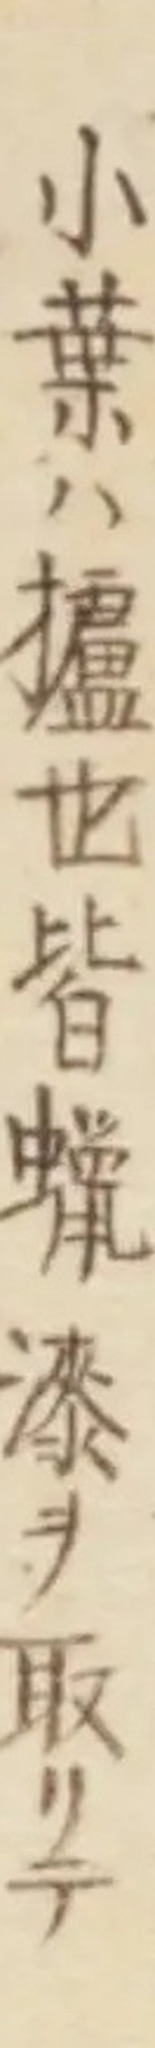小葉櫨也皆蝋漆ヲ取リテ
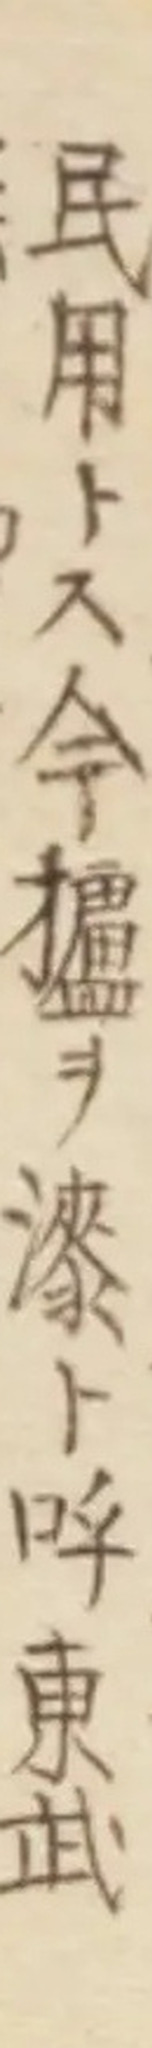民用トス今漆ト呼ブ東武
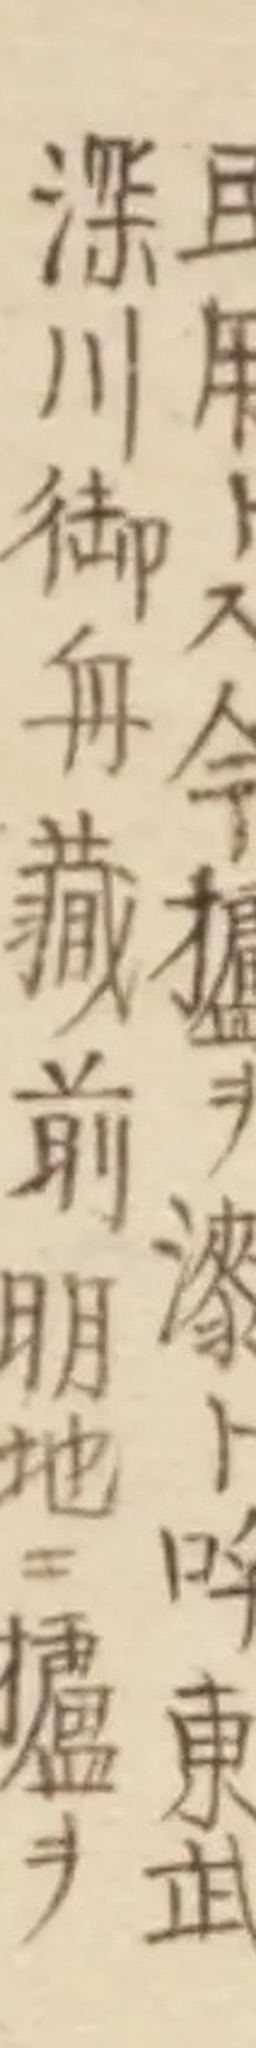深川御舟蔵前明地ニ櫨ヲ
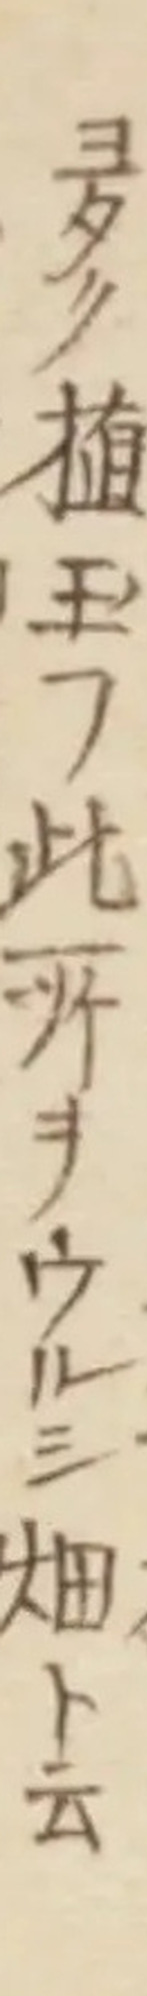多ク植玉フ此所ヲウルシ畑ト云
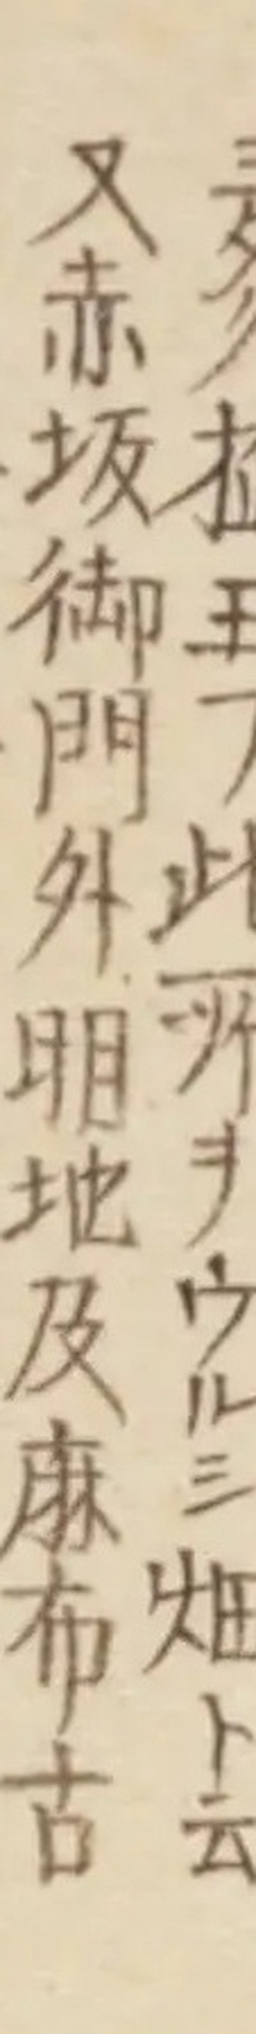又赤坂御門外明地及麻布古
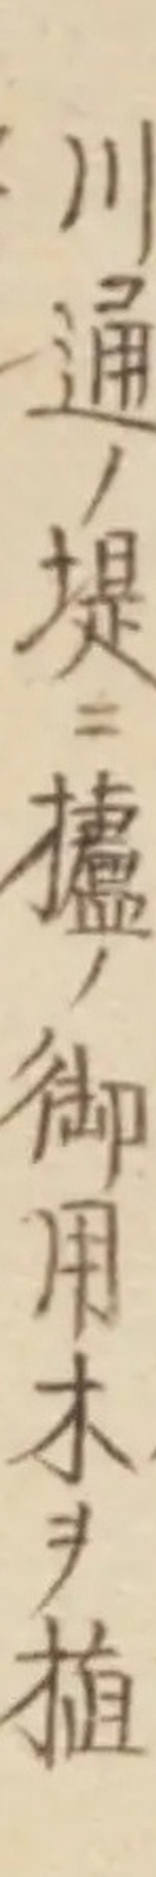川通ノ堤ニ櫨ノ御用木ヲ植
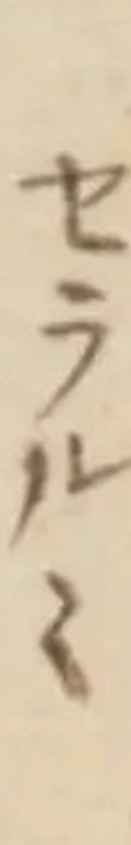セラルヽ
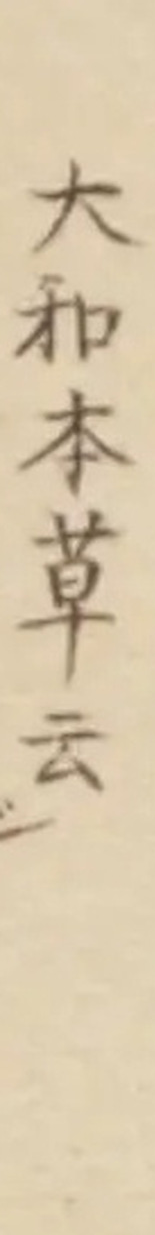大和本草云
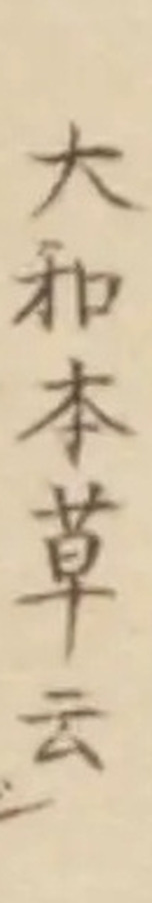大和本草云
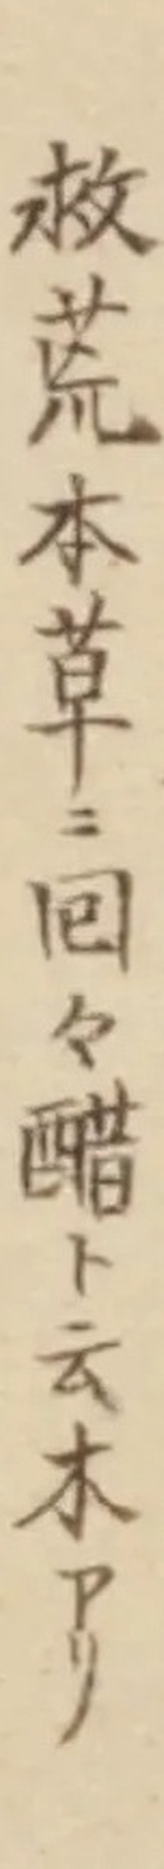救荒本草ニ回々醋ト云木アリ
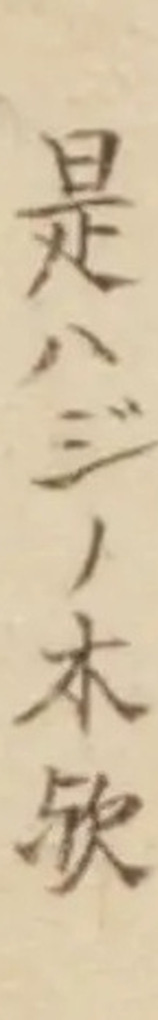是ハジノ木歟
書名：梅園草木花譜夏之部. 3
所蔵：国立国会図書館 National Diet Library, JAPAN
